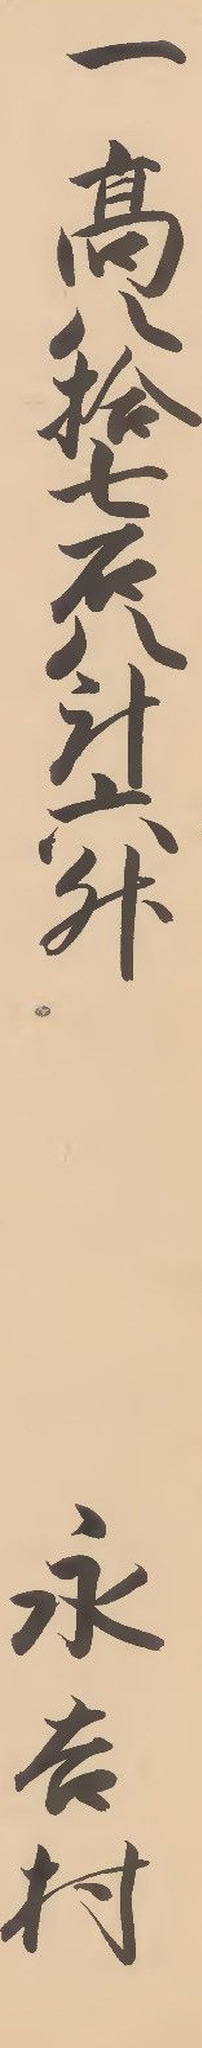一高八拾七石八斗六升永吉村
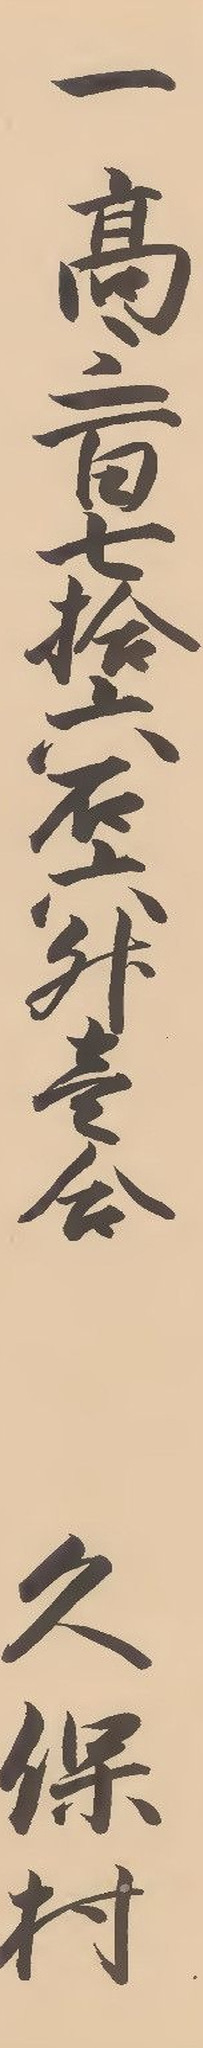一高三百七拾六石六升壱合久保村
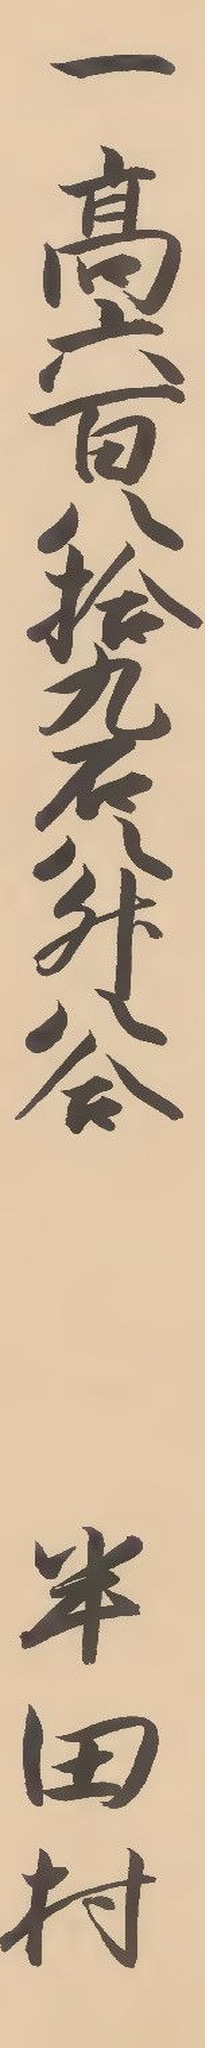一高六百八拾九石八升八合半田村
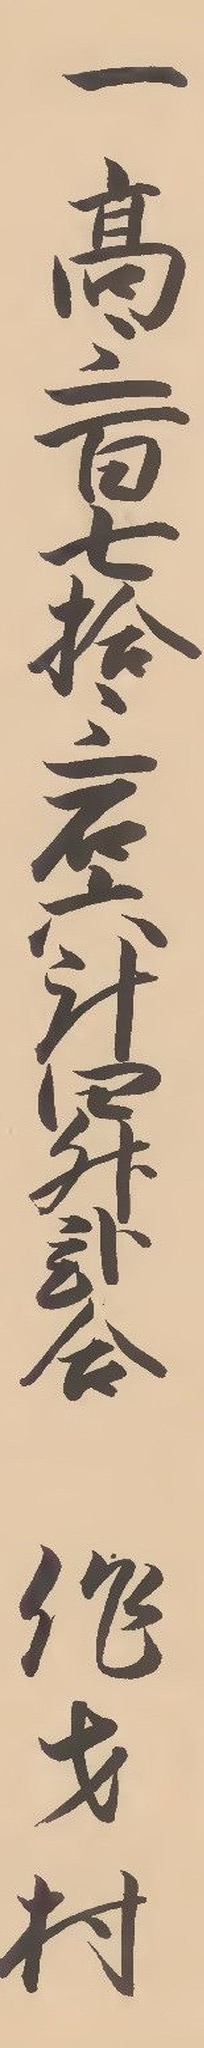一高三百七拾三石六斗四升弐合作才村
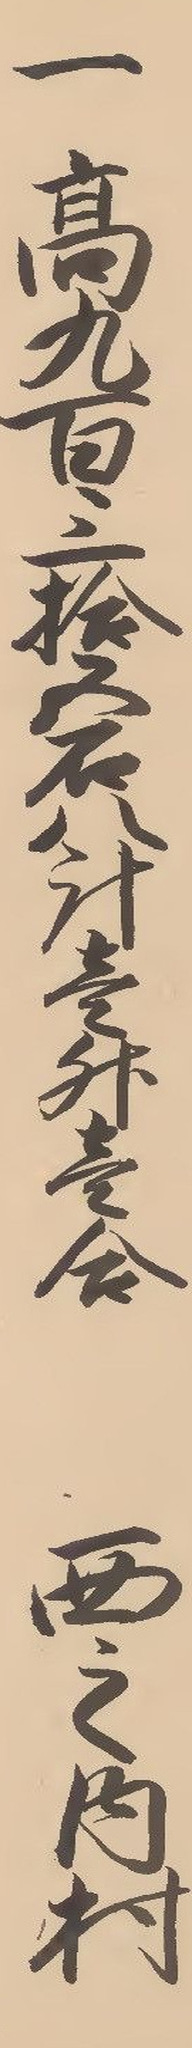一高九百三拾五石八斗壱升壱合西之内村
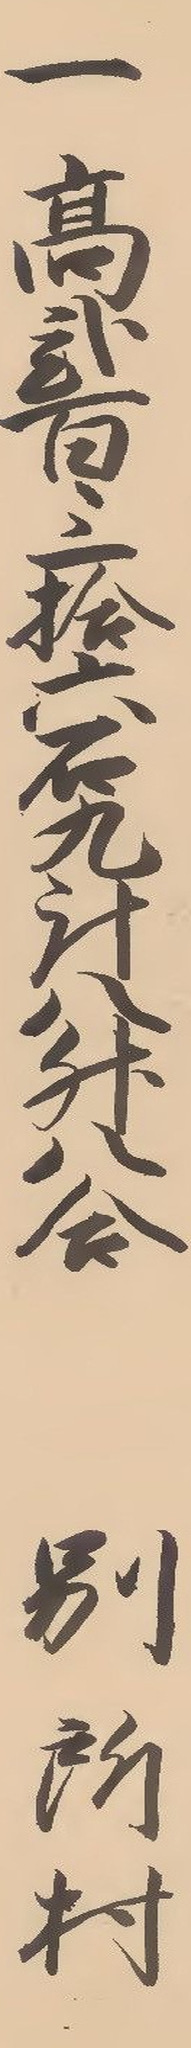一高弐百三拾六石九斗八升八合別所村
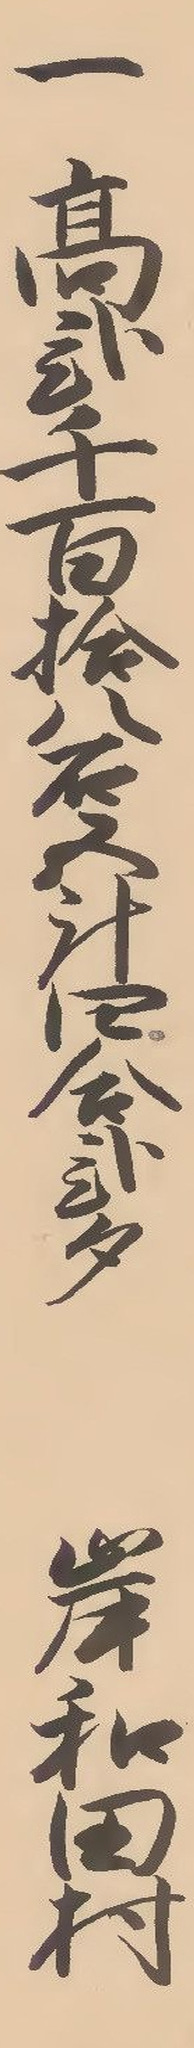一高弐千百拾八石五斗四合弐勺岸和田村

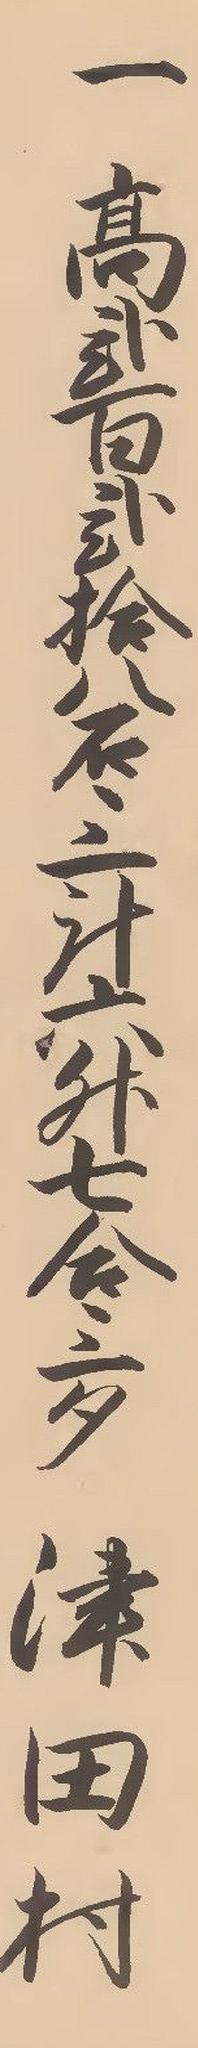一高弐百弐拾八石三斗六升七合三勺津田村
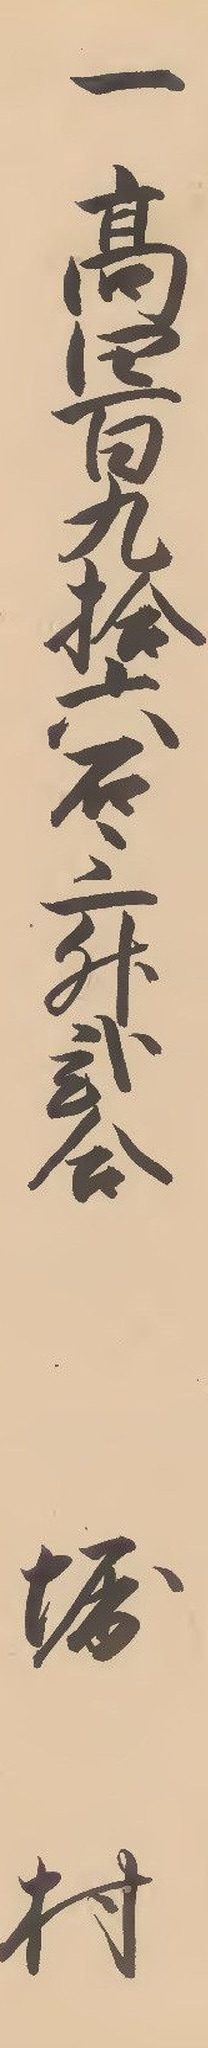一高四百九拾六石三升弐合堀村
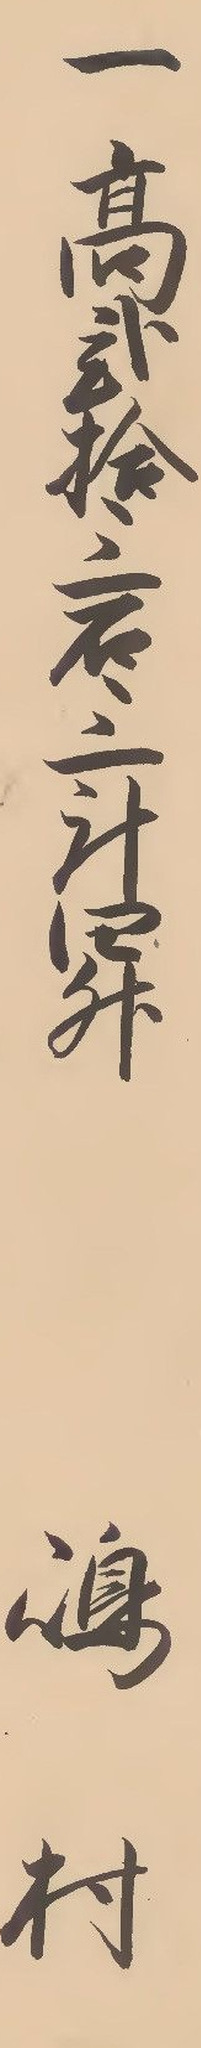一高弐拾三石三斗四升嶋村
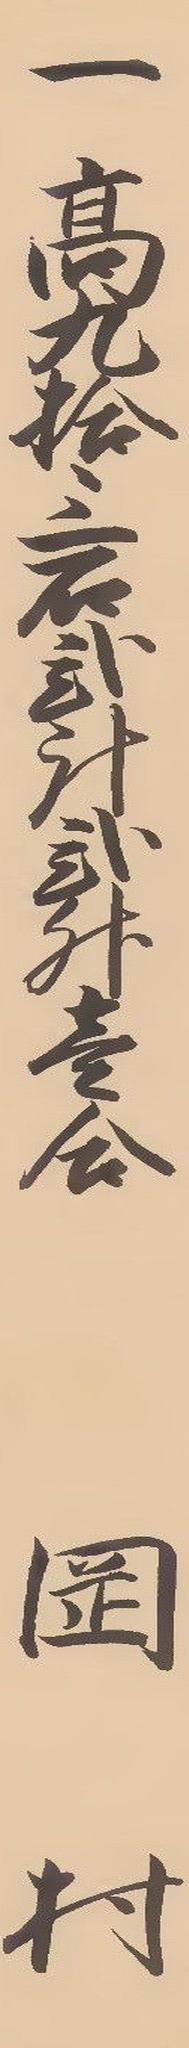一高九拾三石弐斗弐升壱合岡村
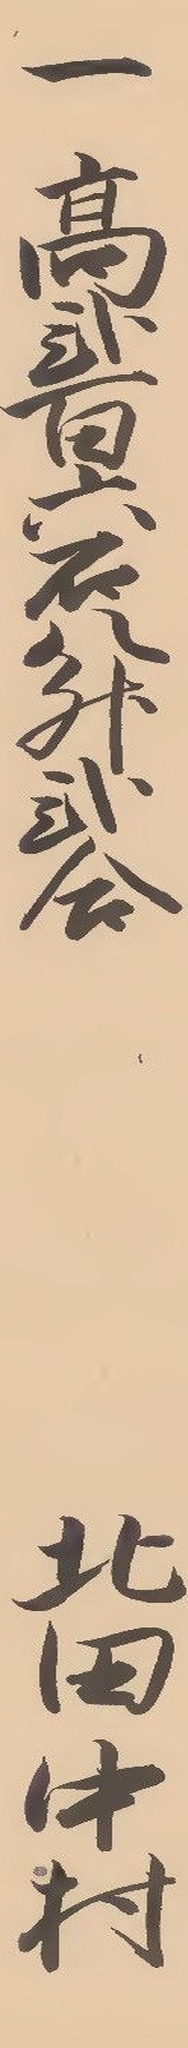一高弐百六石八升弐合北田中村
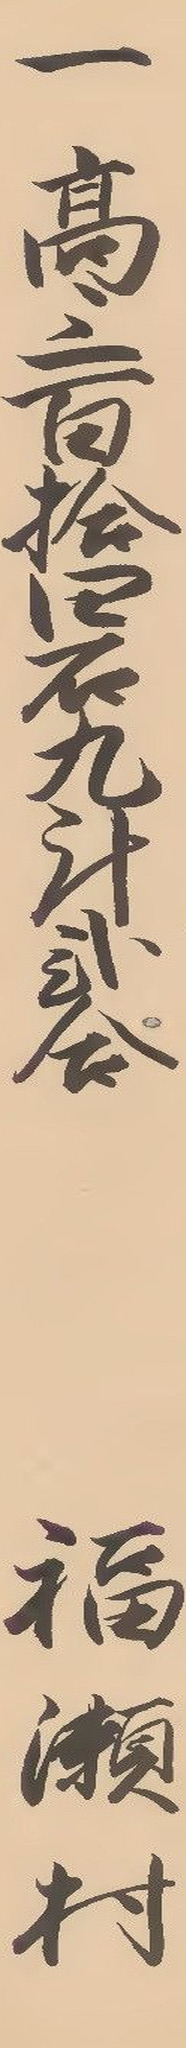一高三百拾四石九斗弐合福瀬村

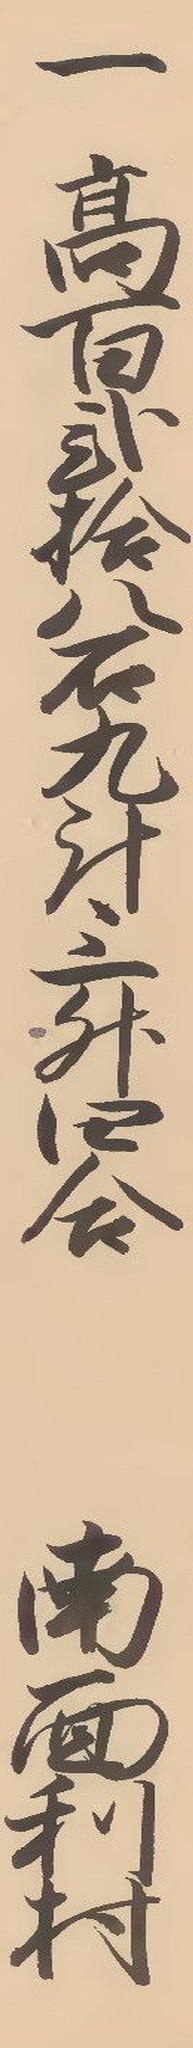一高百弐拾八石九斗三升四合南面利村
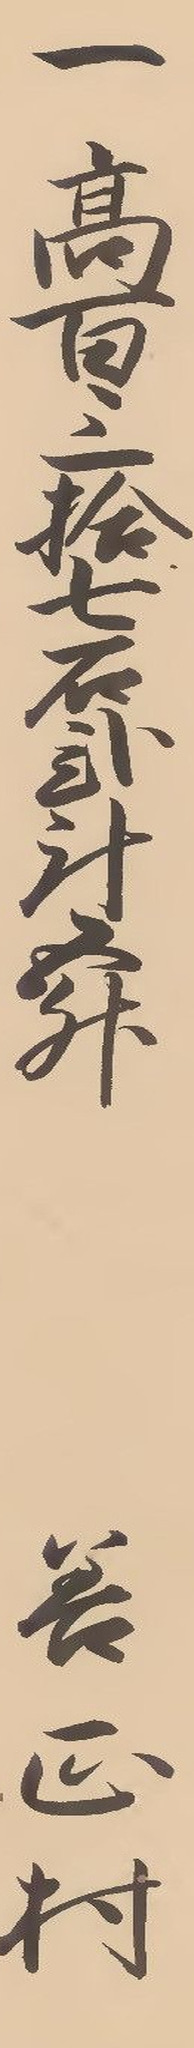一高百三拾七石弐斗五升善正村
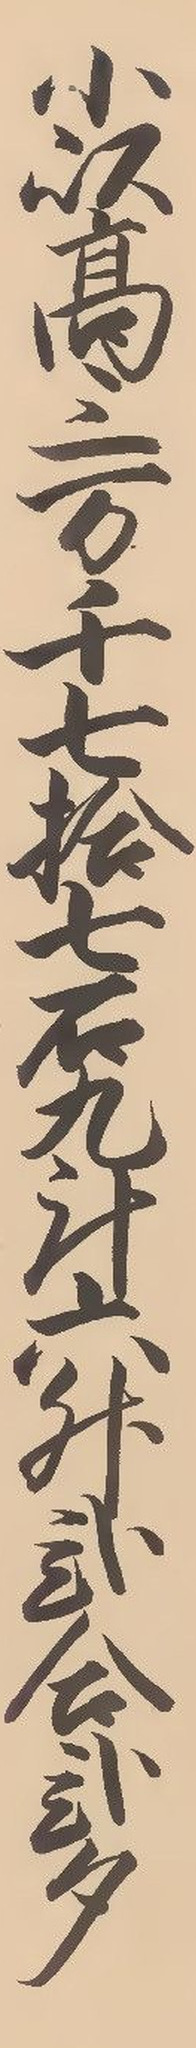小以高三万千七拾七石九斗六升弐合弐勺
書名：和泉国郷帳
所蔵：国立公文書館 National Archives of Japan
